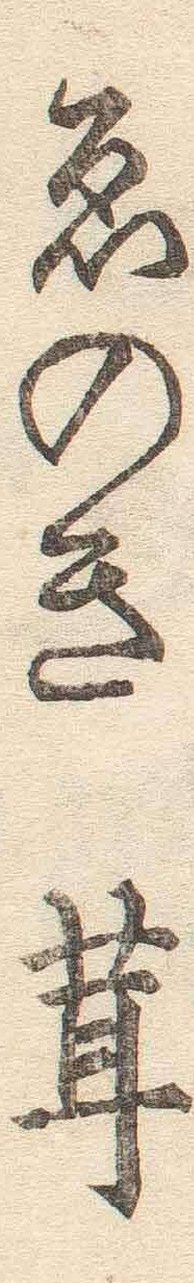ゑのき茸
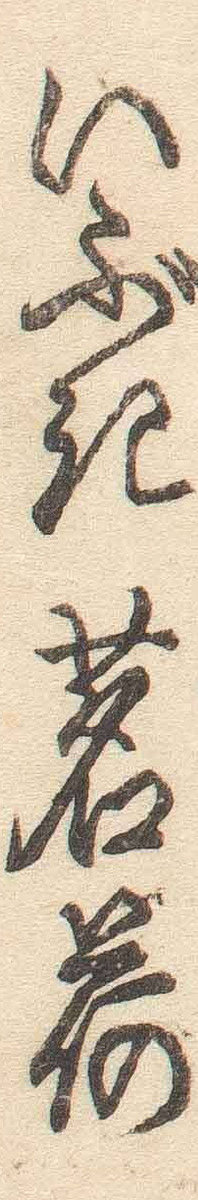いぶき茗荷

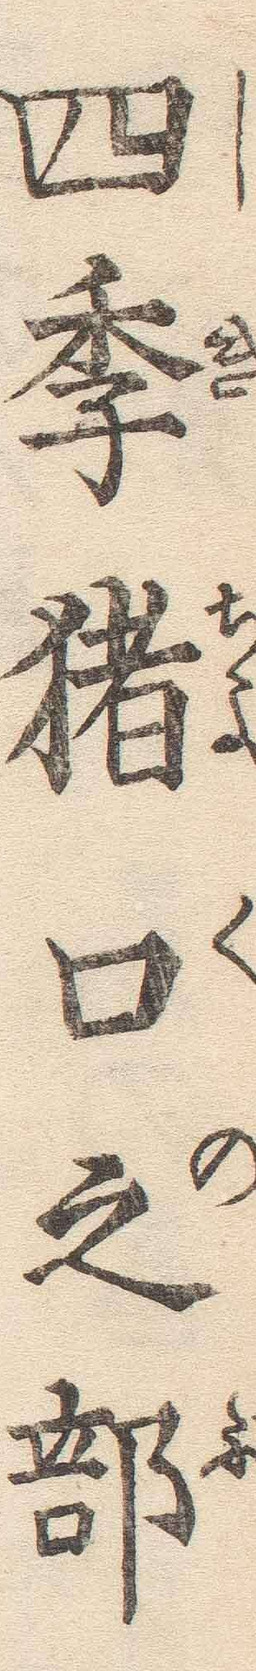四季猪口之部
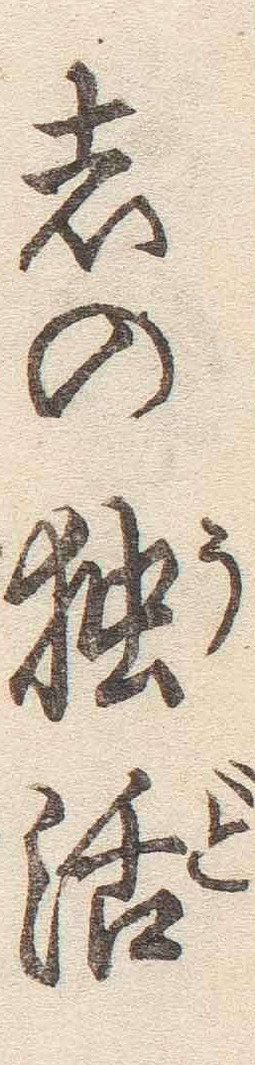しの独活
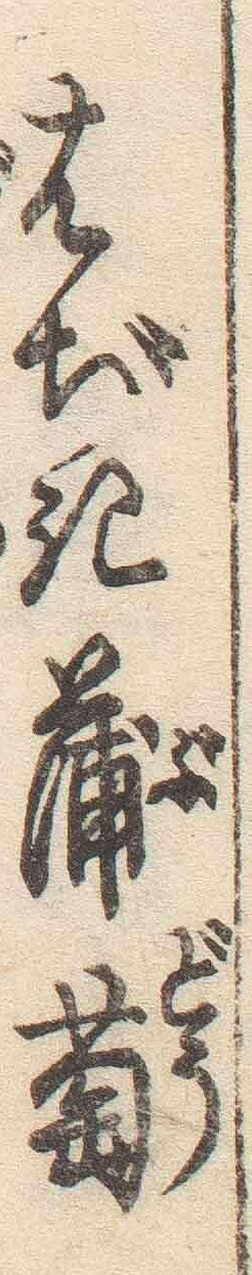はぢき葡萄
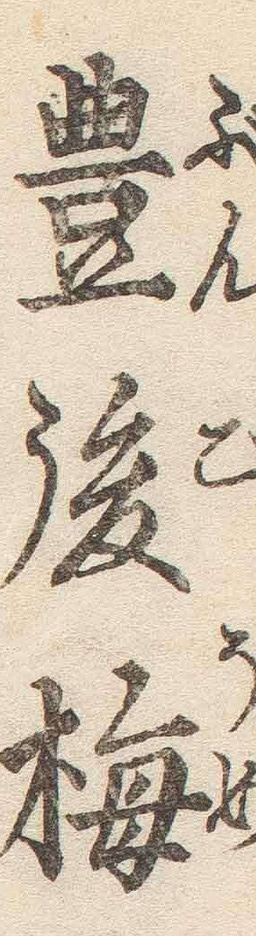豊後梅
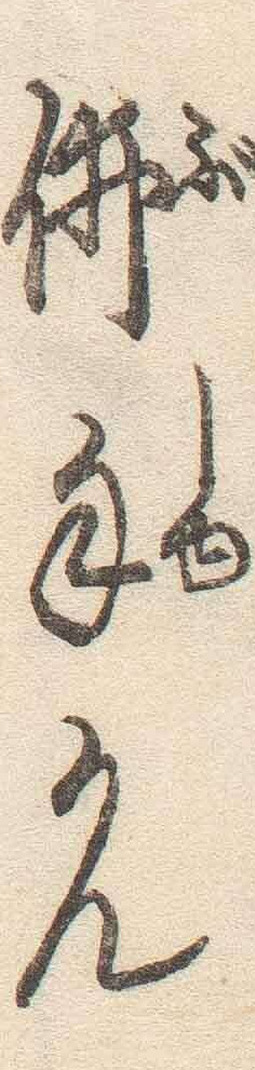仏手かん
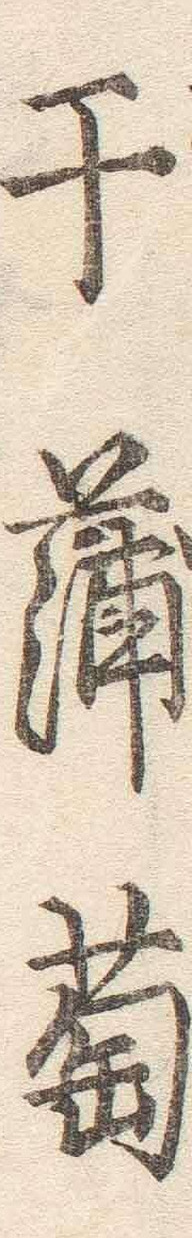干葡萄
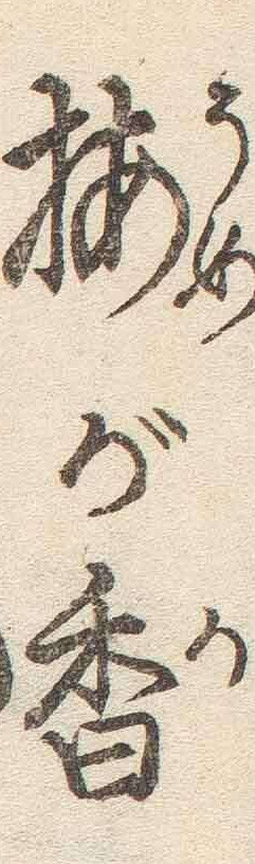梅が香
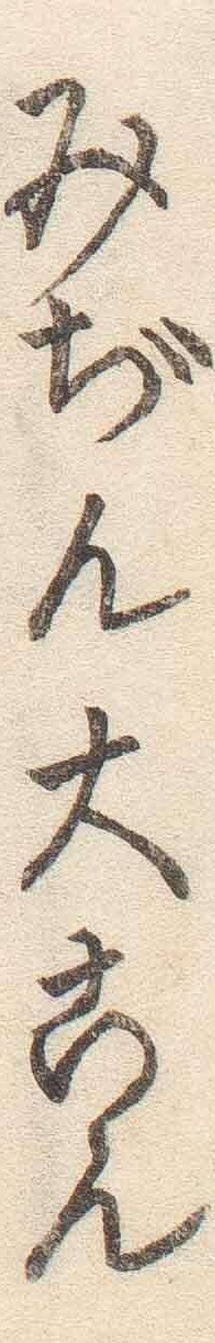みぢん大こん
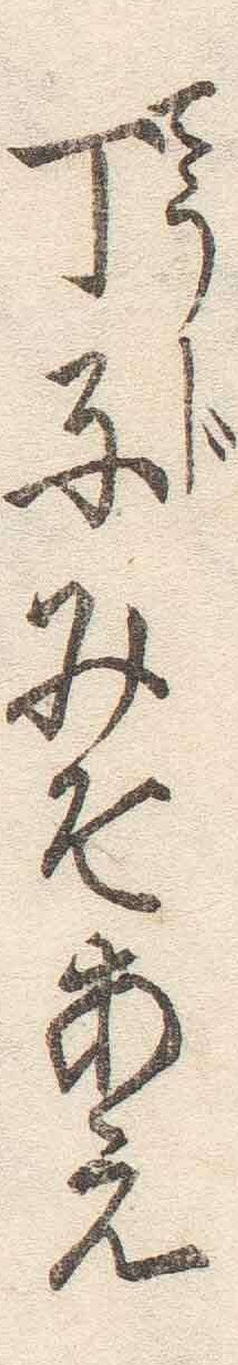丁子みそあえ
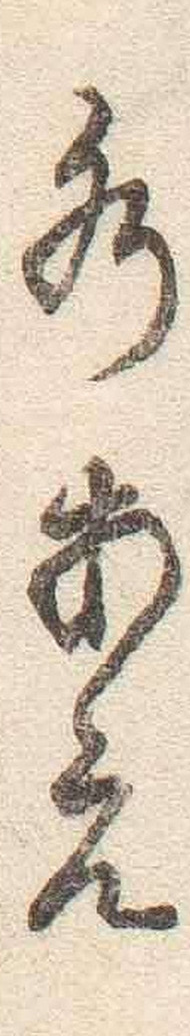水あえ
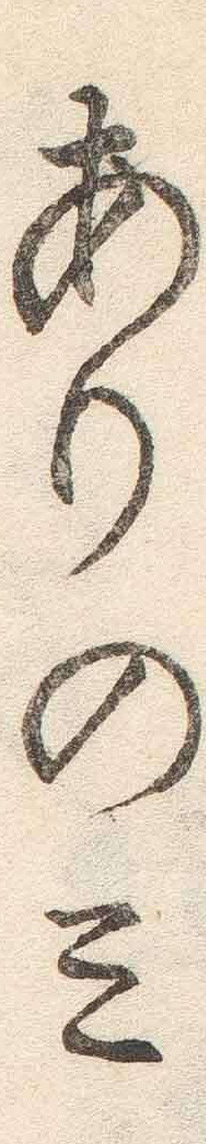ありのみ
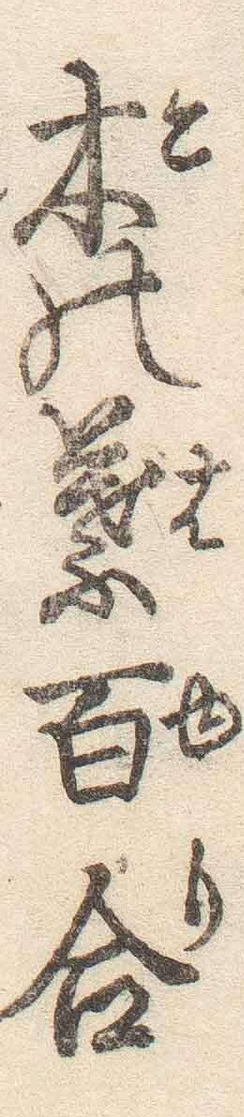木の葉百合
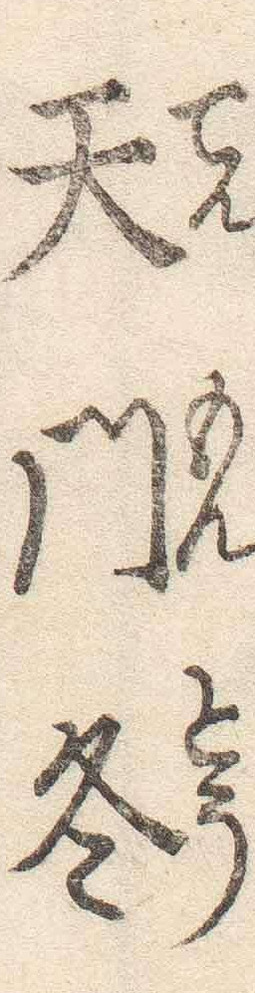天門冬
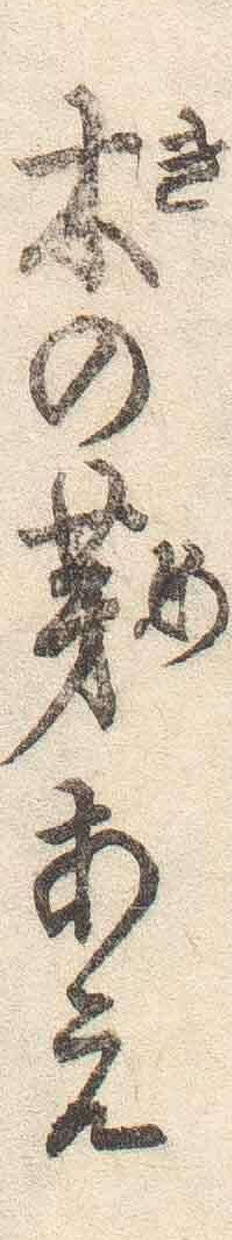木の芽あえ
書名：料理通
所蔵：東京学芸大学附属図書館 国文学研究資料館
